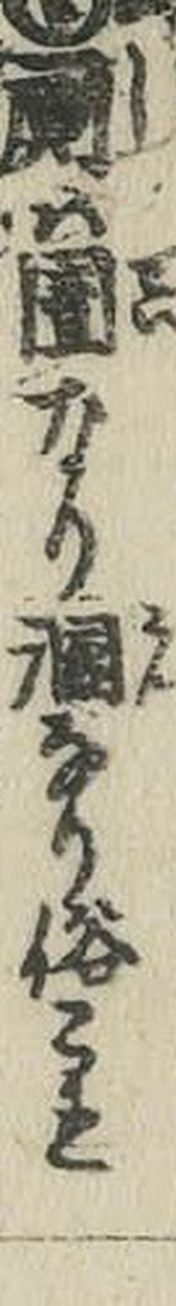○廁は圊なり溷なり俗これ
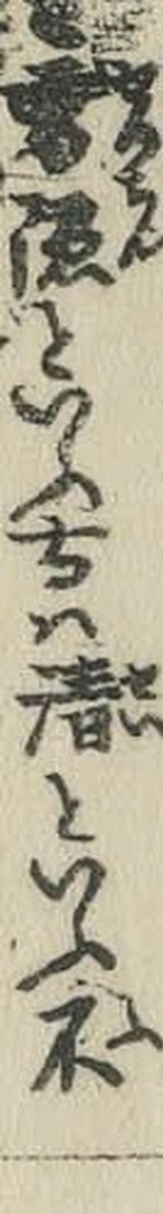を雪隠といふ古は清といふ不
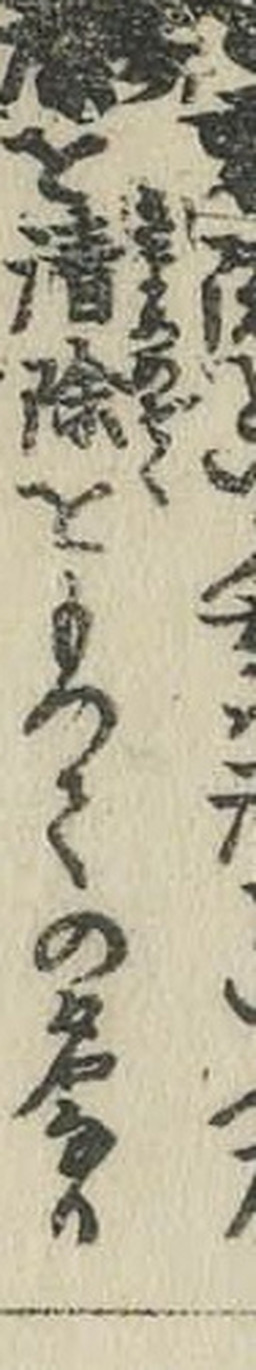潔を清除をもつての名なり
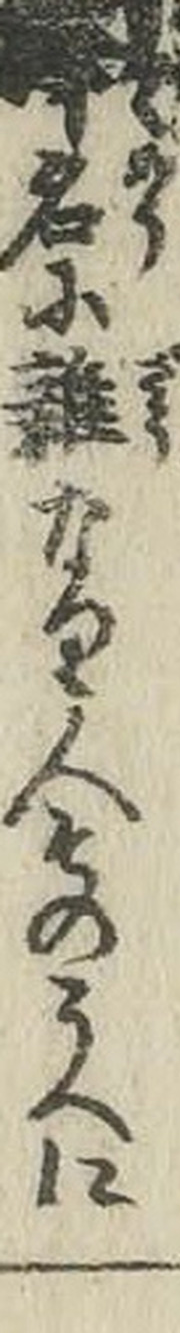釈名に雑なり人そのうへに
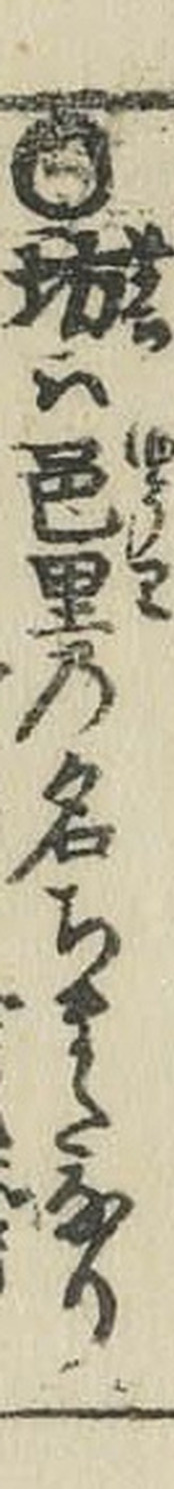○坊は邑里の名ちまたなり
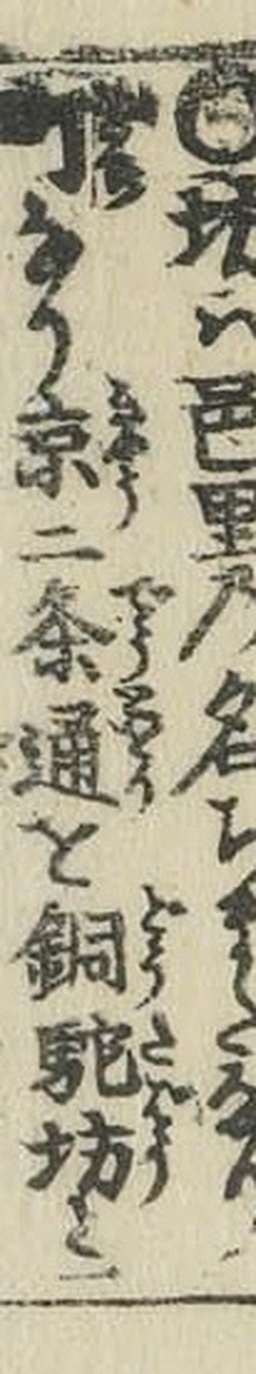町なり京二条通を銅駝坊と
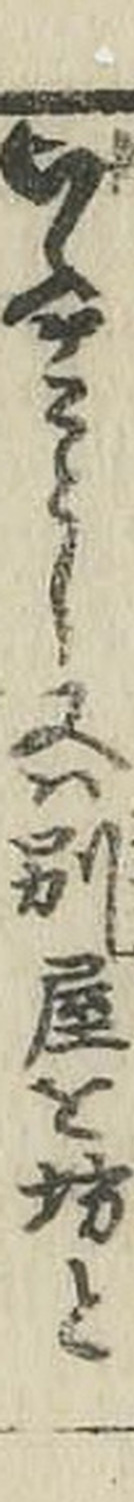いふがことし又は別屋を坊と
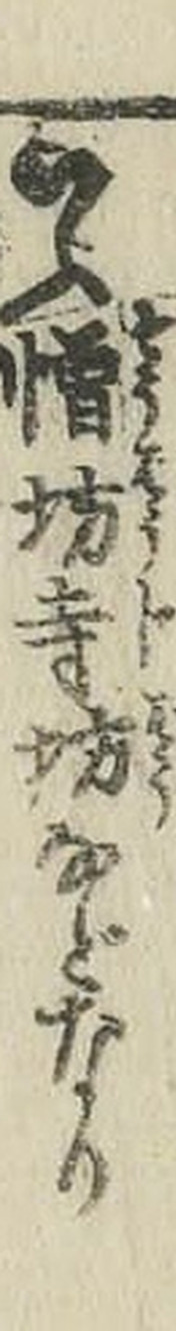いふ憎坊寺坊などなり
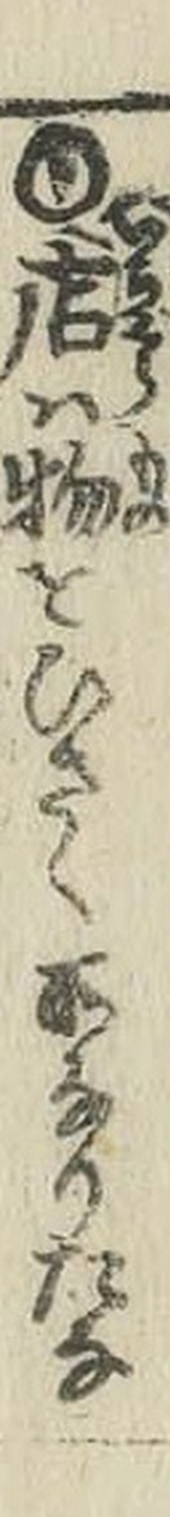○店は物をひさく所なりたな
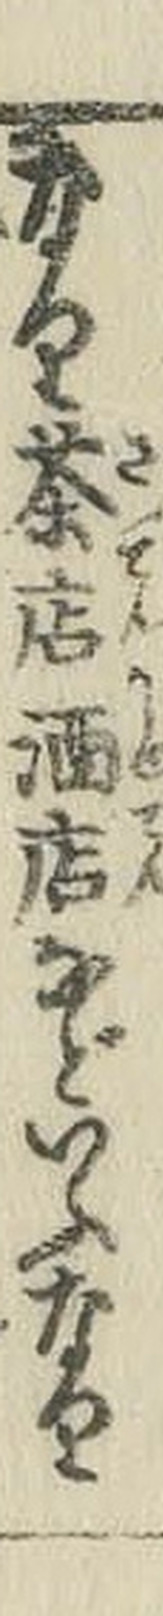なり茶店酒店などいふなり
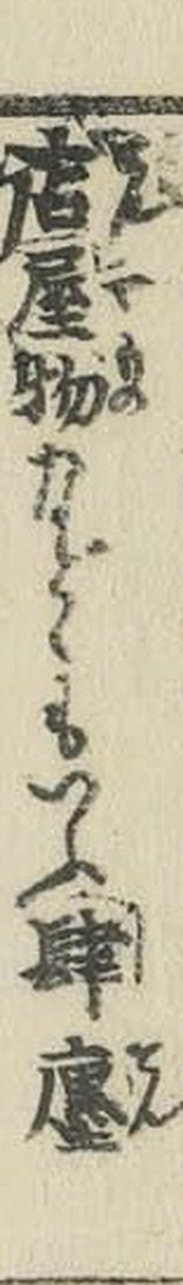店屋物などゝもいふ肆廛
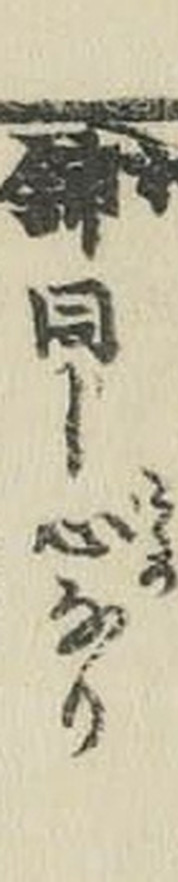舗同し心なり
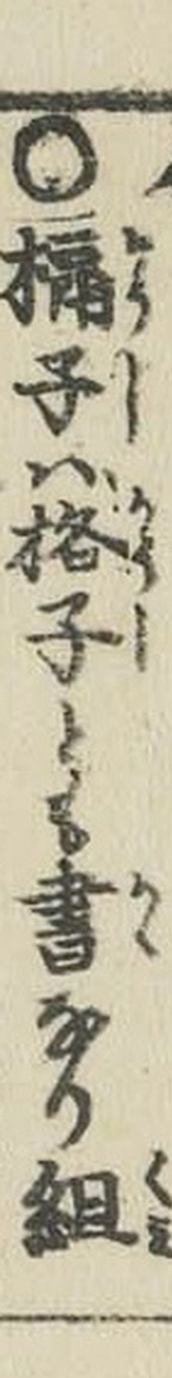○槅子は格子とも書なり組
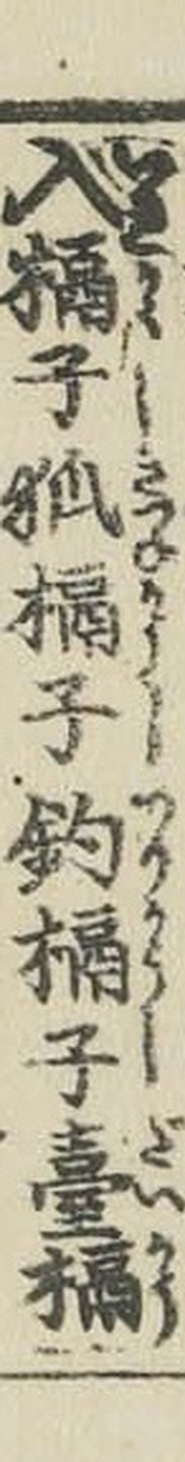入槅子狐槅子釣槅子台槅
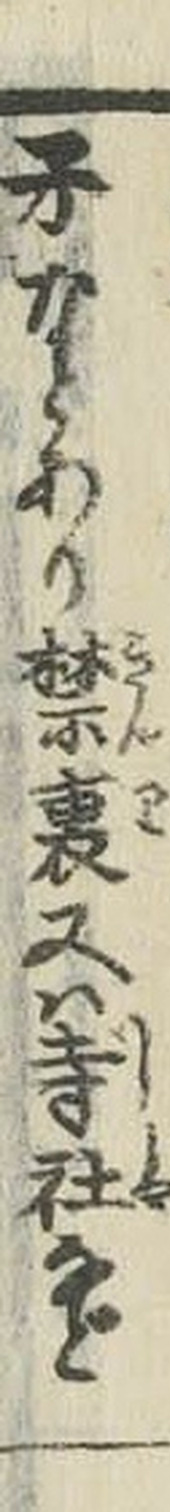子なとあり禁裏又は寺社など
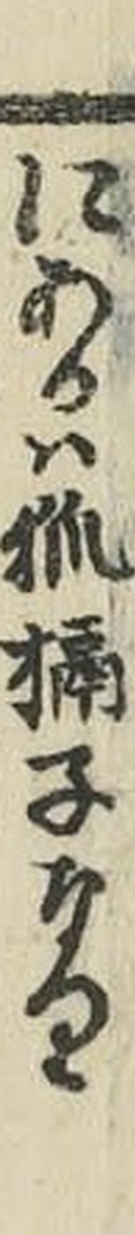にあるは狐槅子なり
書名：増補頭書訓蒙図彙大成 10巻 2:巻之1-3
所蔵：東京学芸大学教育コンテンツアーカイブ
